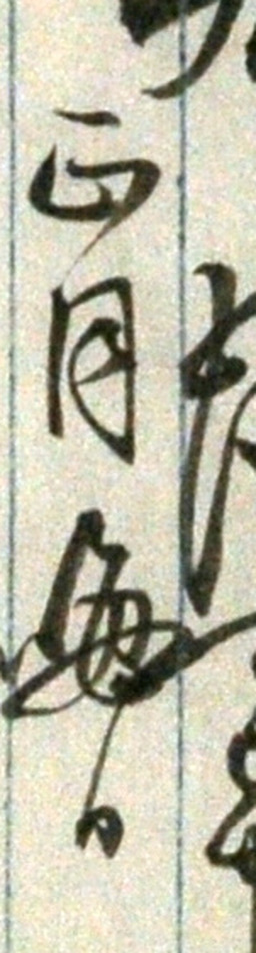正月晦日
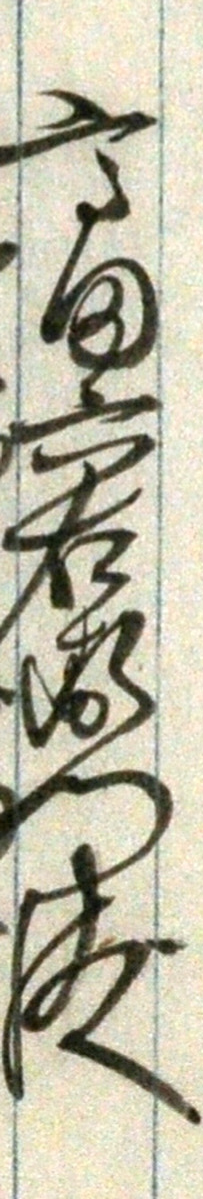高田六右衛門殿
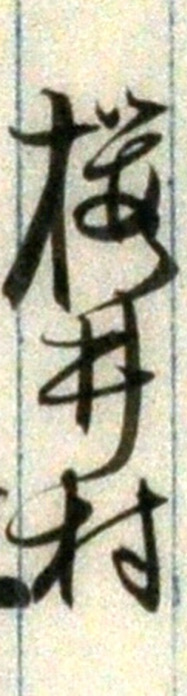桜井村
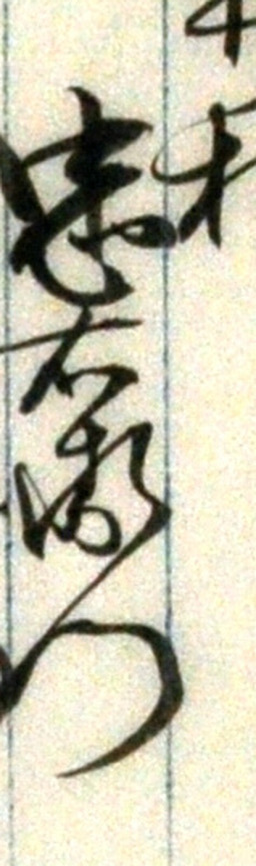忠右衛門
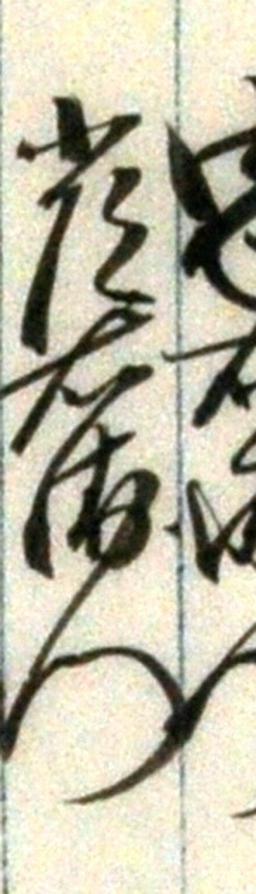常右衛門
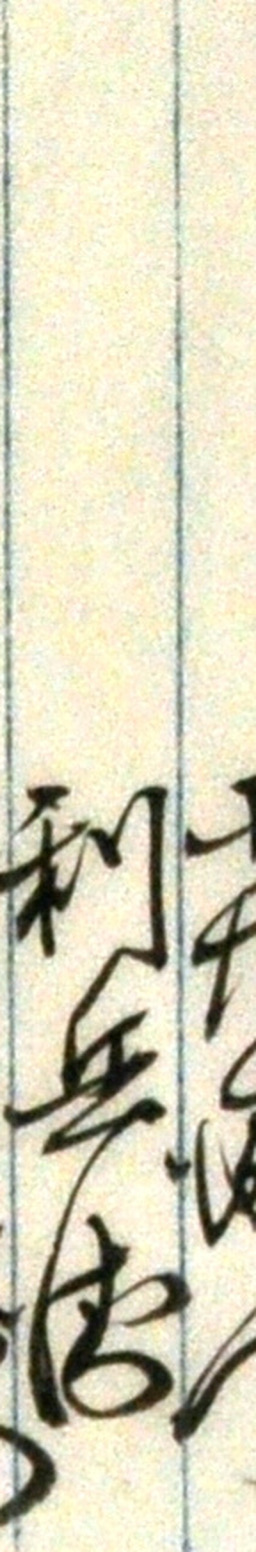利兵衛
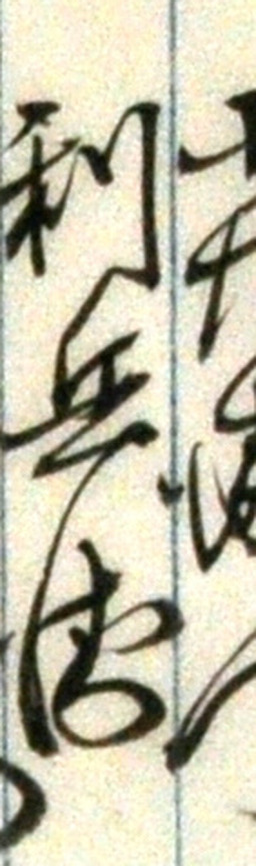利兵衛
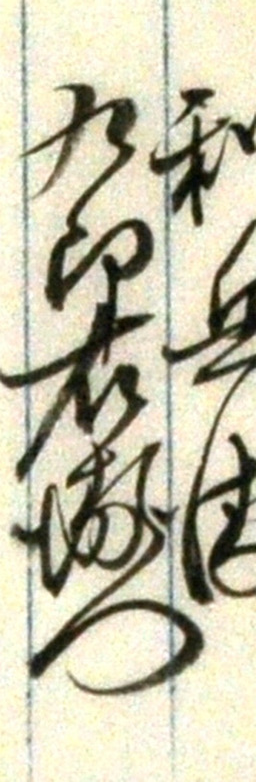九朗右衛門
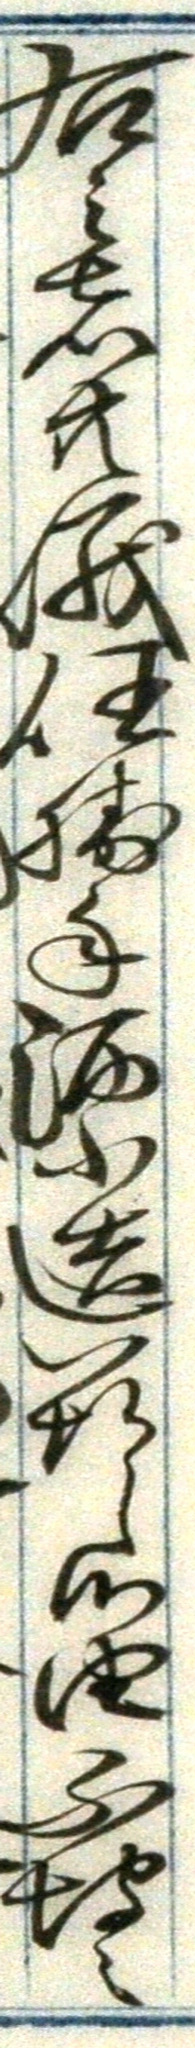右之者共儀任勝手酒小造いたし候由不埒之
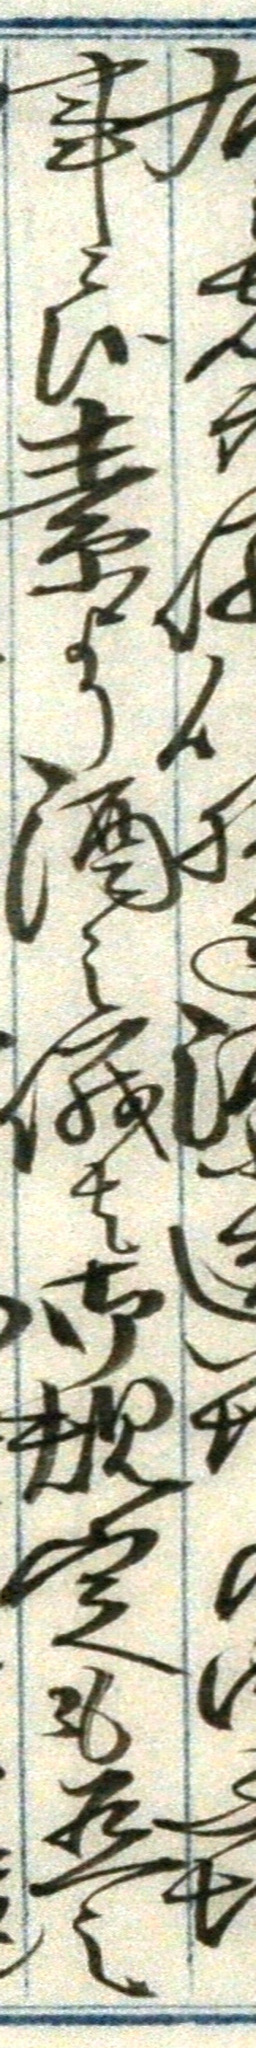事ニ候素より酒之儀は御規定も有之
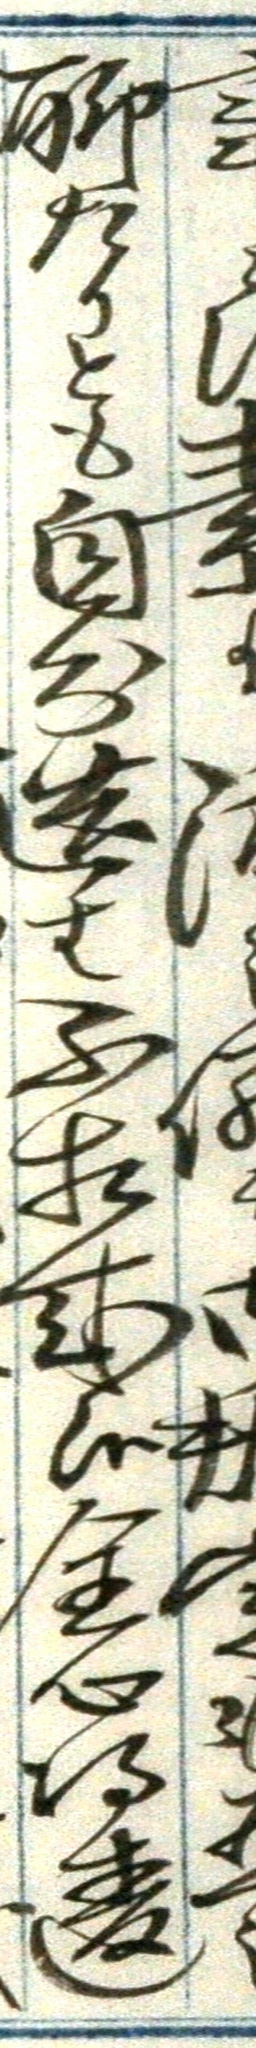聊たりとも自分造は不相成候全心得違
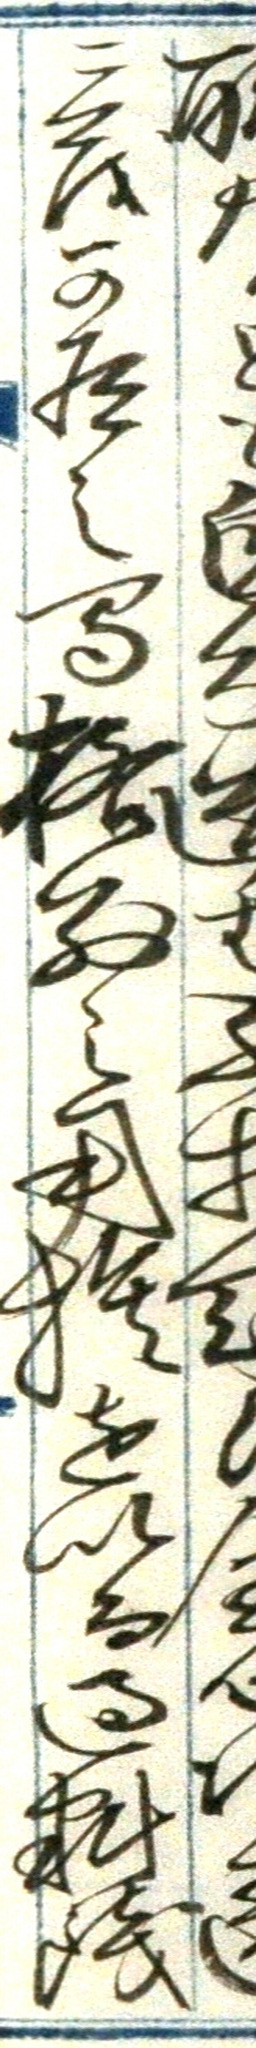ニも可有之間格別之用捨を以而過料銭
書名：入牢手鎖申渡書・過怠金申渡書
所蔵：伊那市立高遠町図書館・合同会社AMANE
